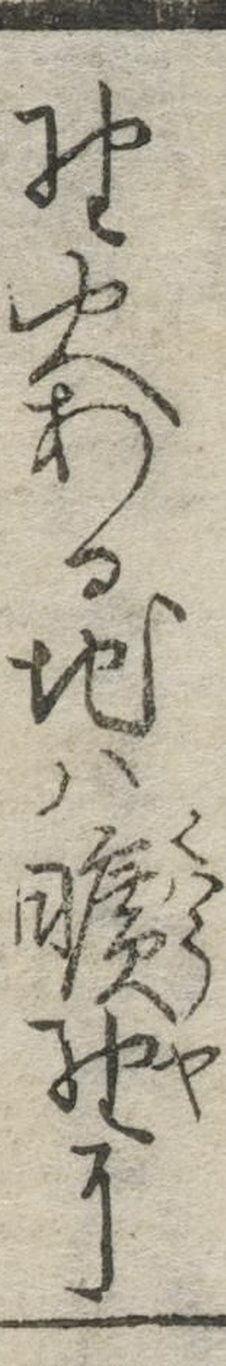性火ある地は曠野に
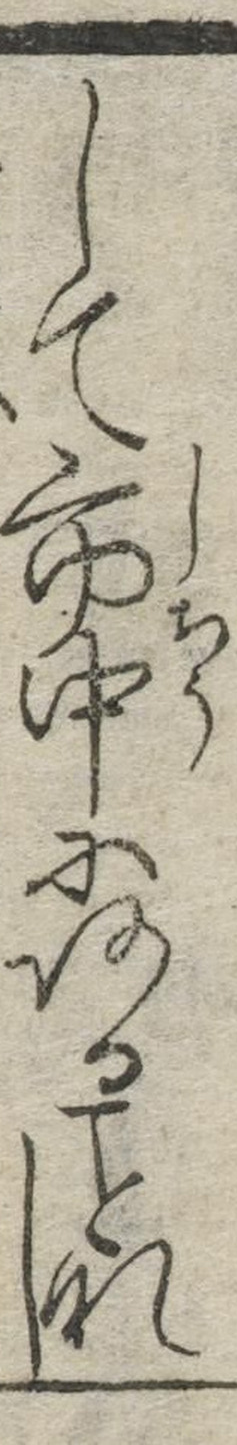して市中にあることなし
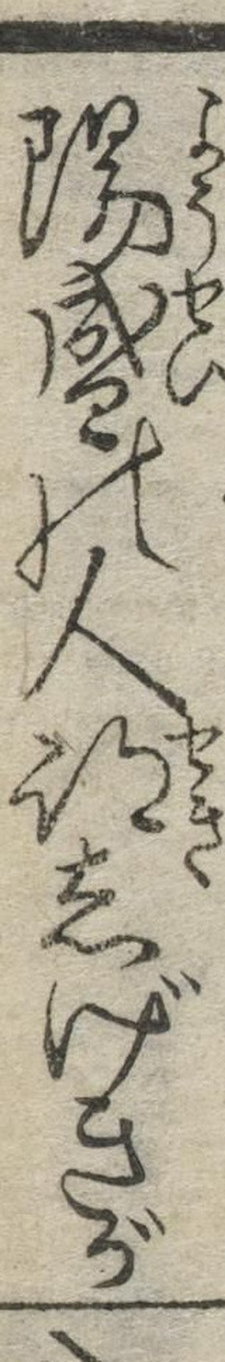陽盛の人跡しげきが

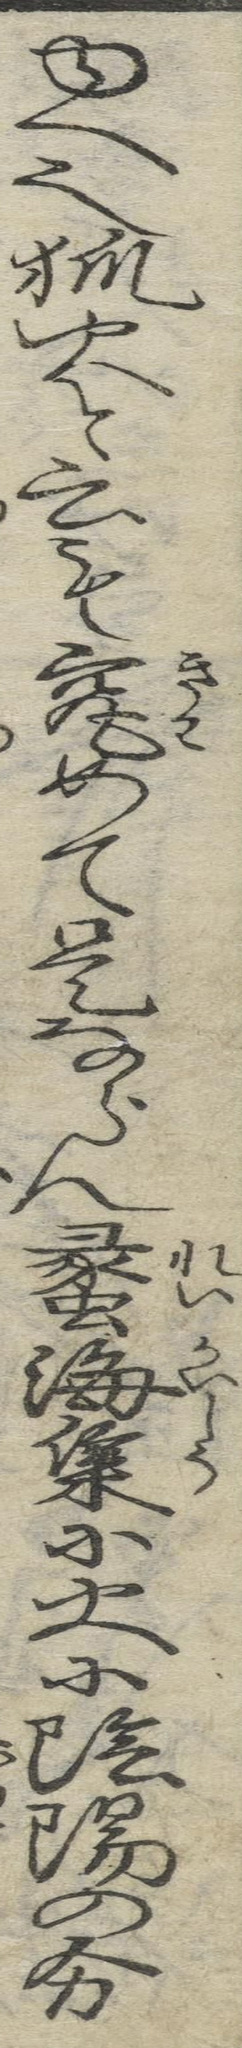ゆへ也狐火と云うも究めて是ならん㚑海集に火に陰陽の分
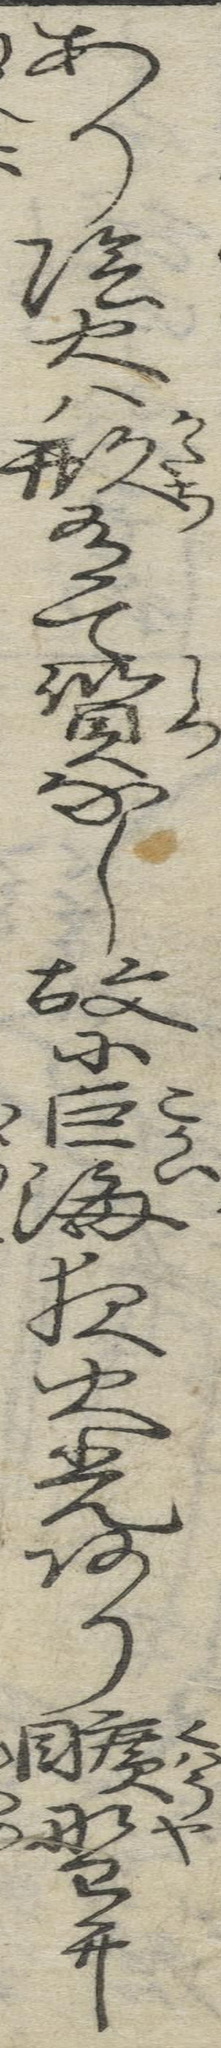あり陰火は形有て質なし故に巨海夜火光あり曠野并
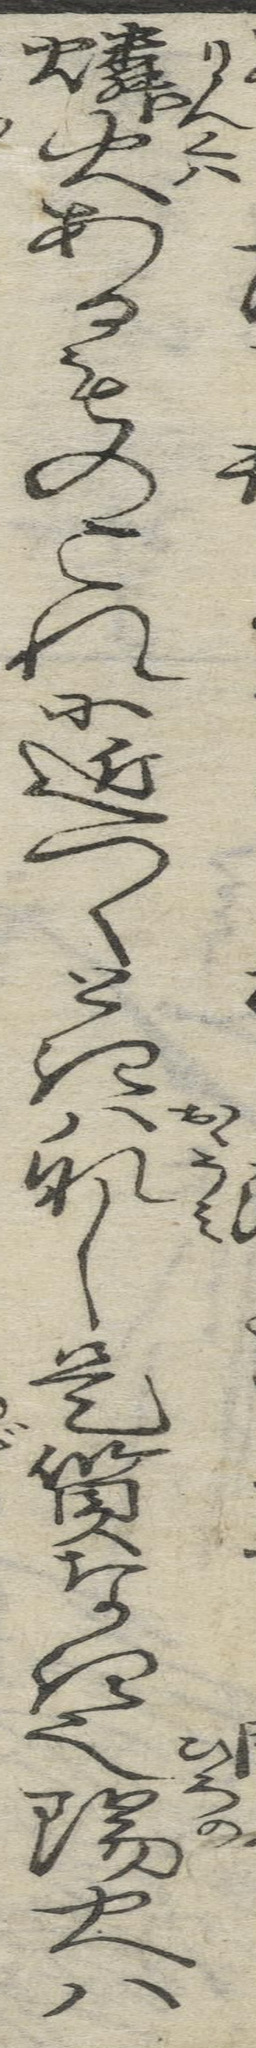燐火あるものこれ近つくときはなし是質なき也陽火は
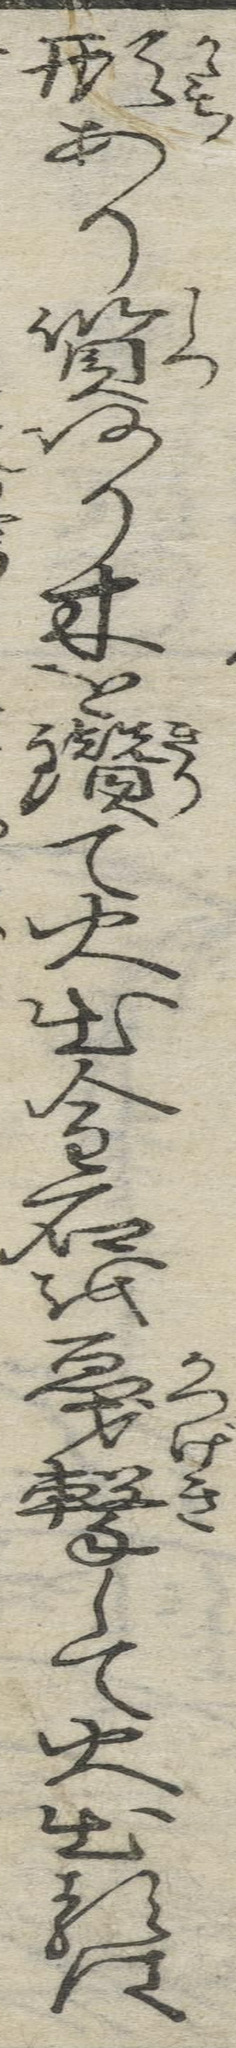形あり質あり木を鑽て火出金石を憂撃して火出るは
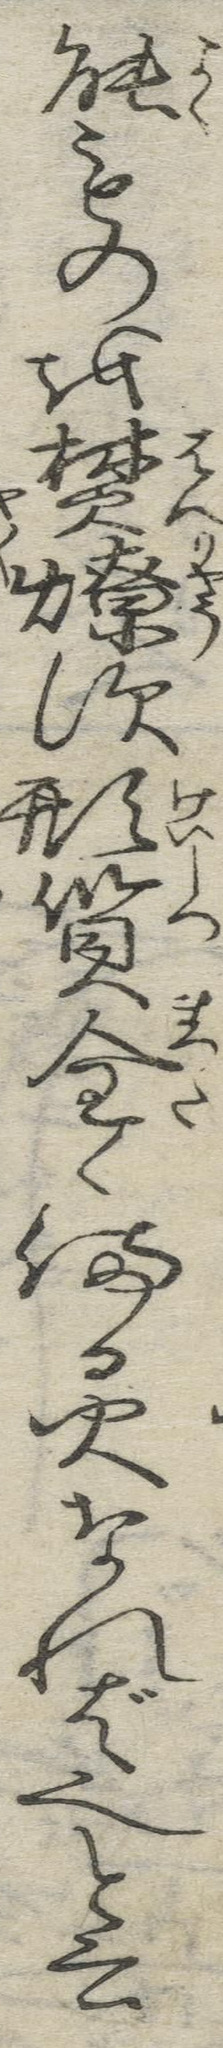能ものを焚燎す形質全く満る火なれば也と云
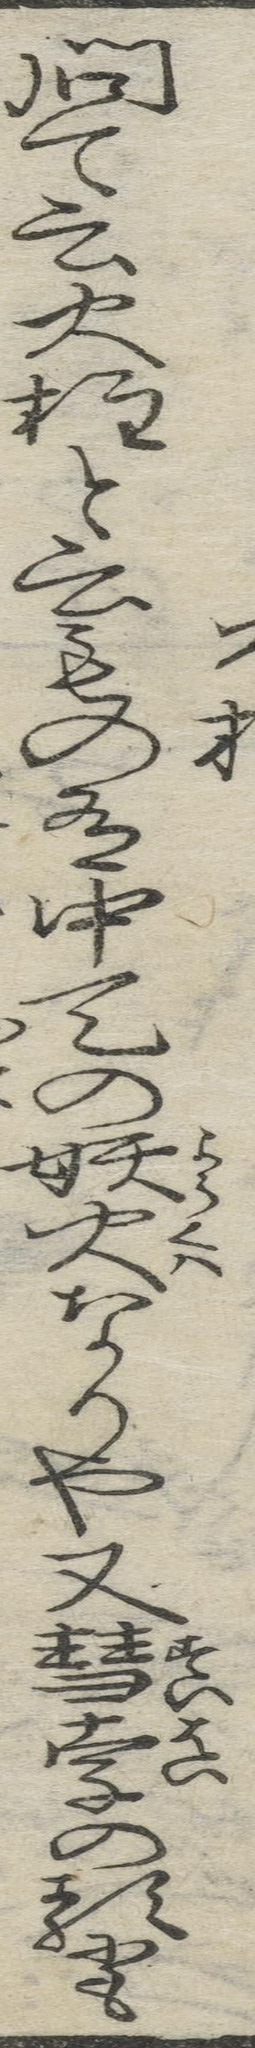問て云火柱と云もの有中天の妖火なりや又彗孛の類にも
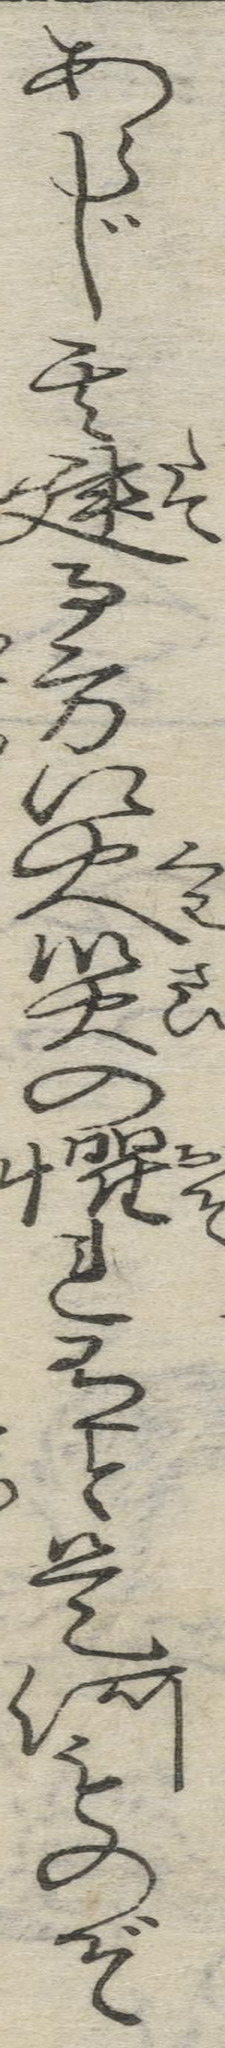あらじ其建る方に火災の懼れ有と是何ものぞ
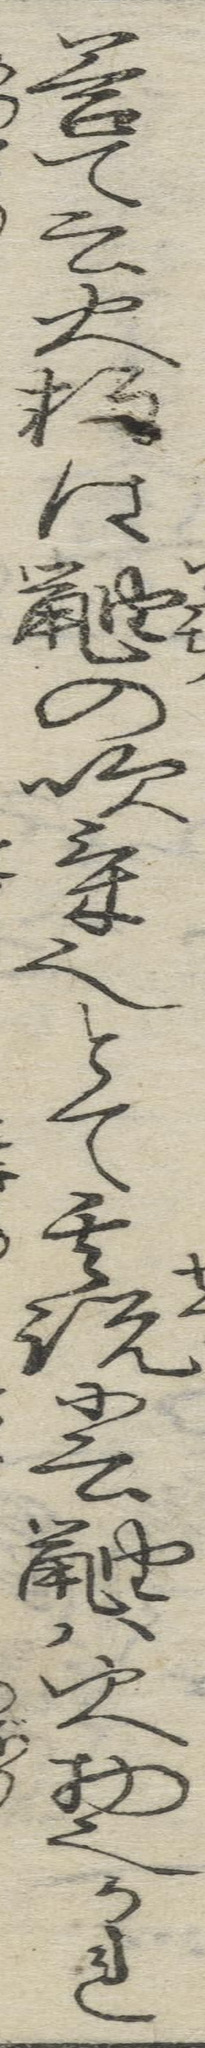答て云火柱は鼬の吹気也とて其説に云鼬は火物也かれ
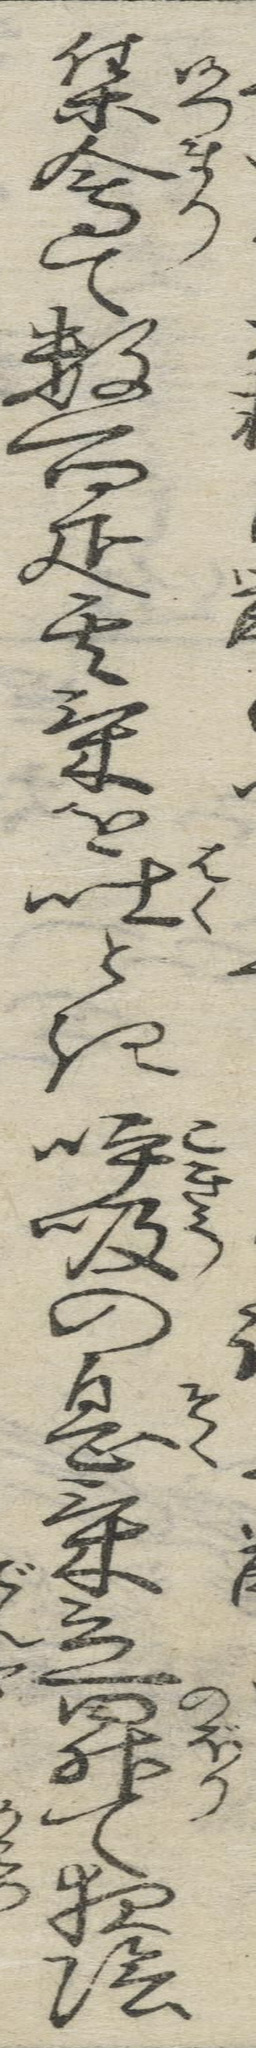集会て数百疋其気を吐とき呼吸の息気立昇て夜陰
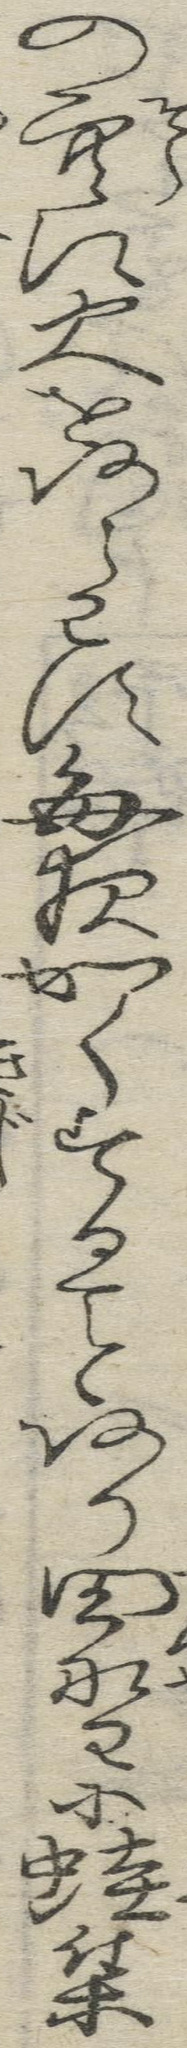の空に火をあらわす毎夜かくすることあり田野に蛙集
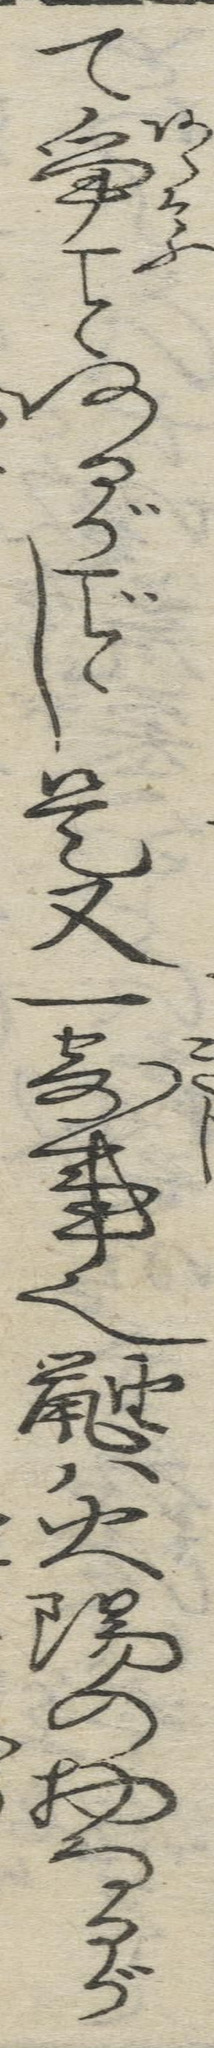て争ことあるがごとし是又一奇事也鼬は火陽の物なるが
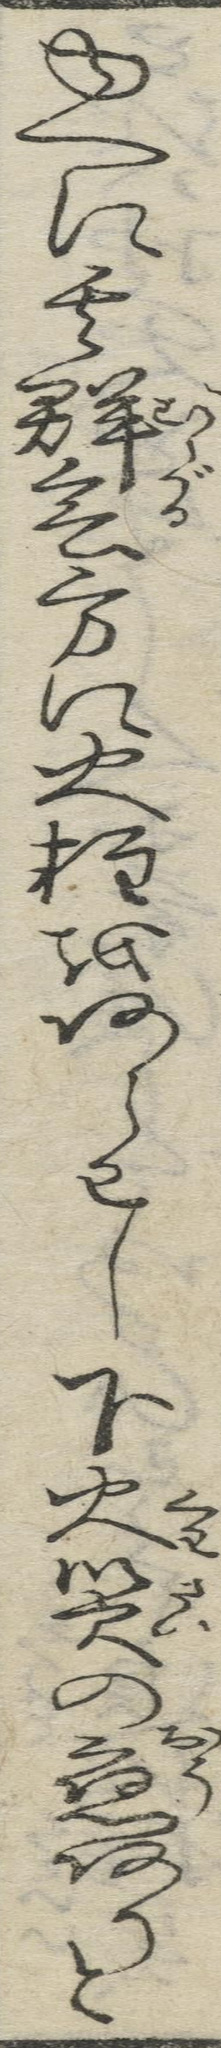ゆへに其群兵方に火柱をあらわし下火災の応ありと
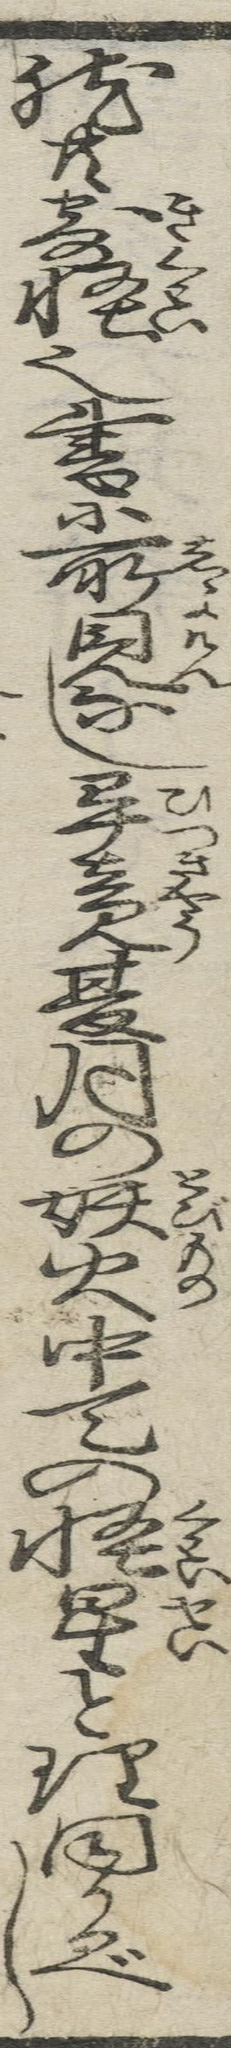然ども奇怪也書に所見なし畢竟夏月の妖火中天の怪星と理同じかるべし
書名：訓蒙天地辨　地
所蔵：東京大学地震研究所図書室 Earthquake Research Institute Library, The University of Tokyo, JAPAN
